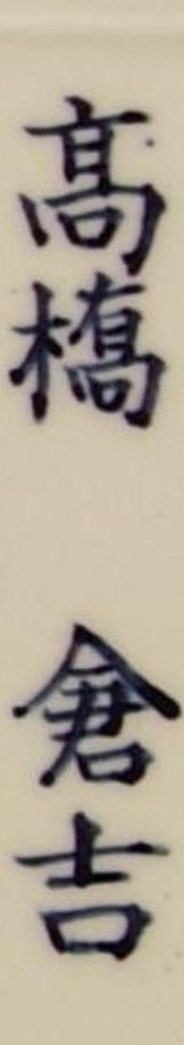高橋倉吉
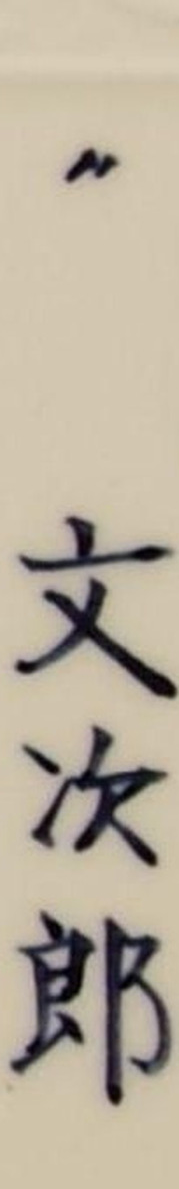文次郎
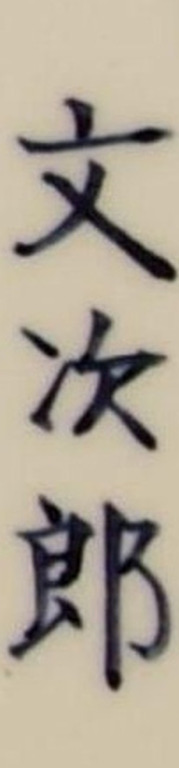文次郎
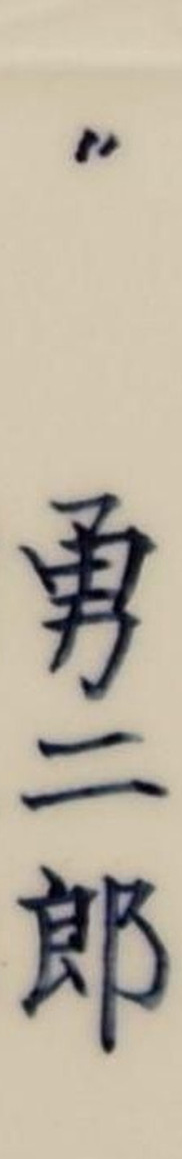勇二郎
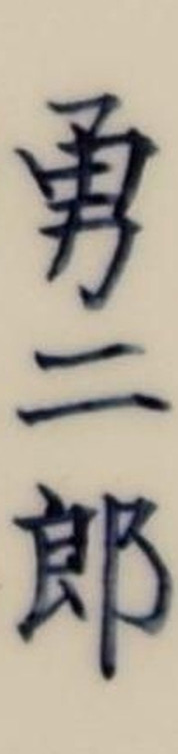勇二郎
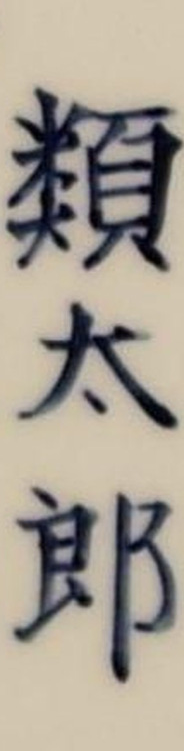類太郎
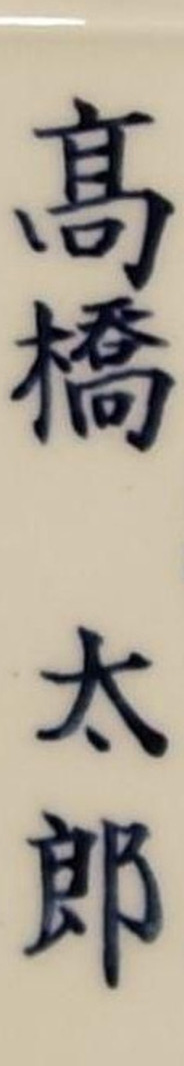高橋太郎
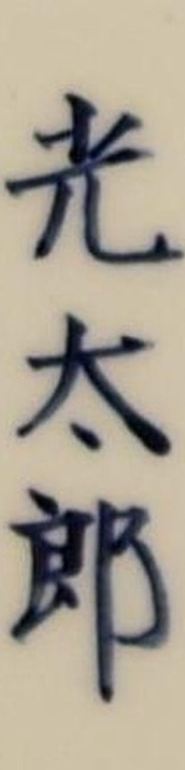光太郎
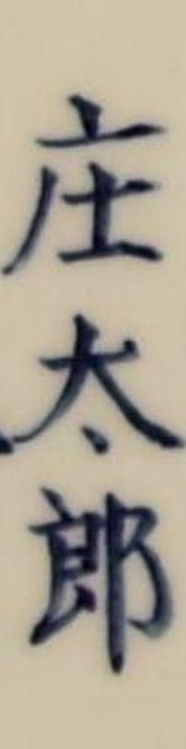庄太郎
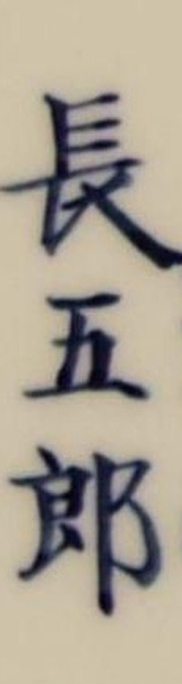長五郎
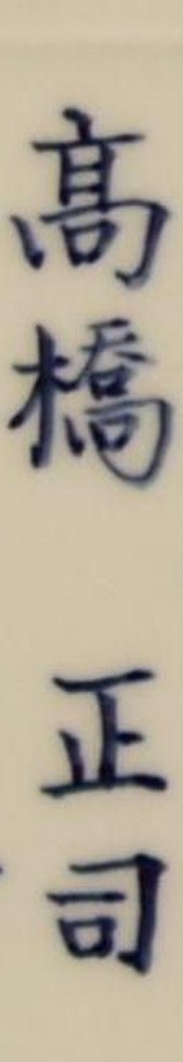高橋正司
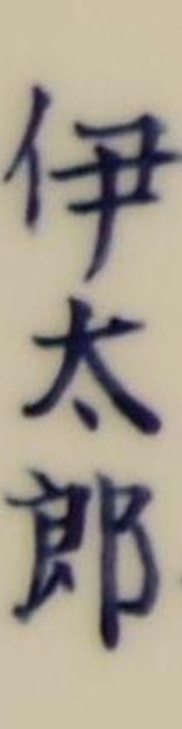伊太郎
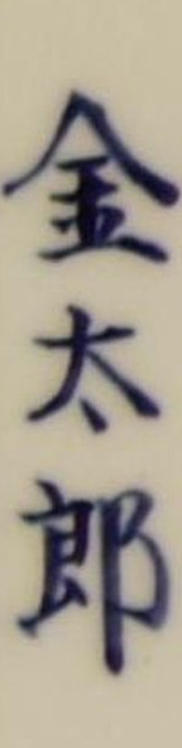金太郎

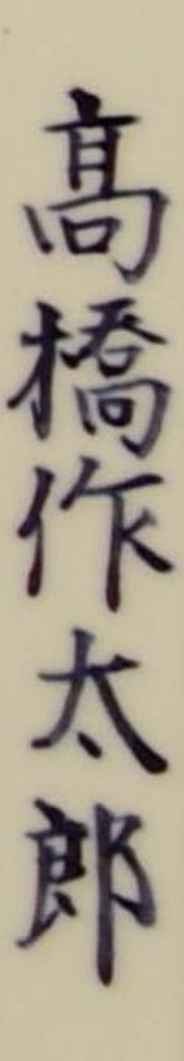高橋作太郎
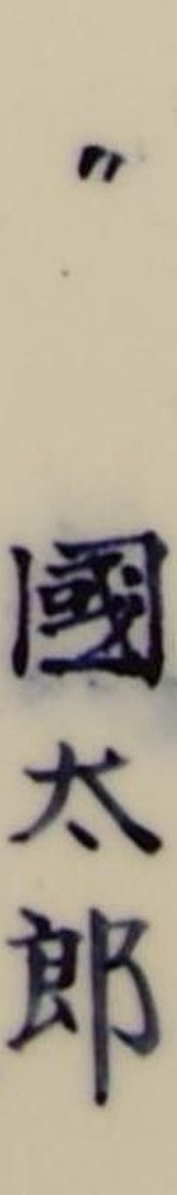國太郎
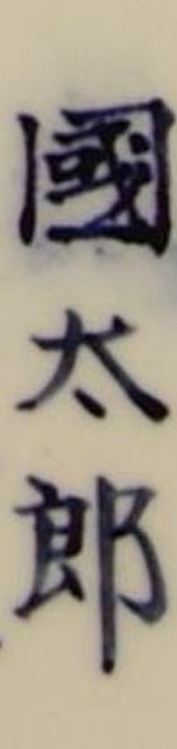國太郎
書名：A~D
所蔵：koyasan kongobuji
